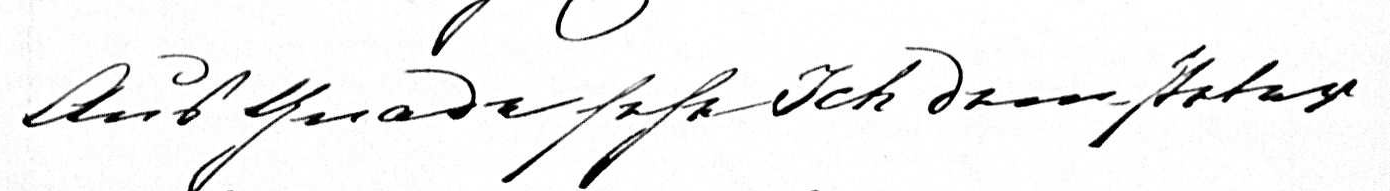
Aus Gnade sehe Ich dem Peter
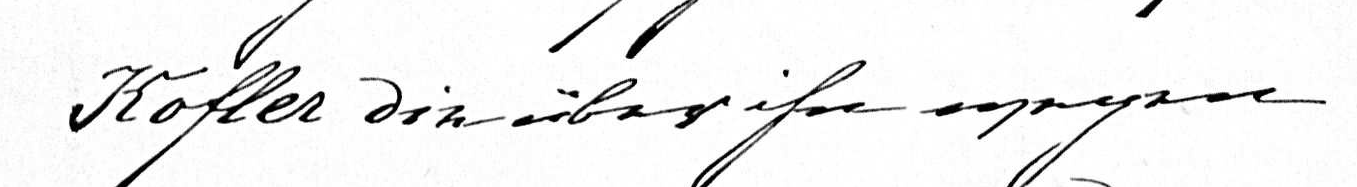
Kofler die über ihn wegen
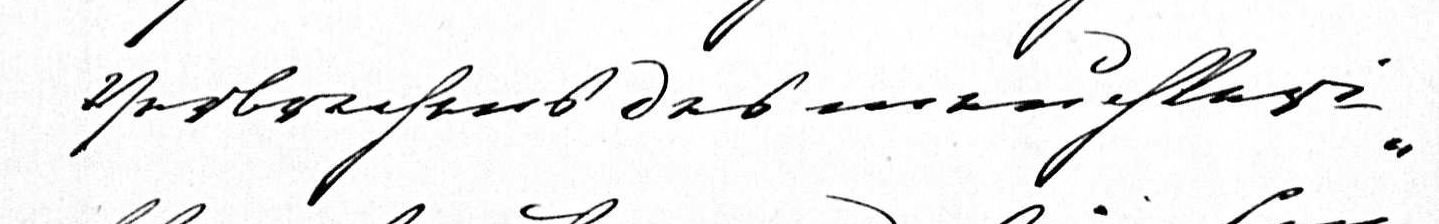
Verbrechens des meuchleri¬
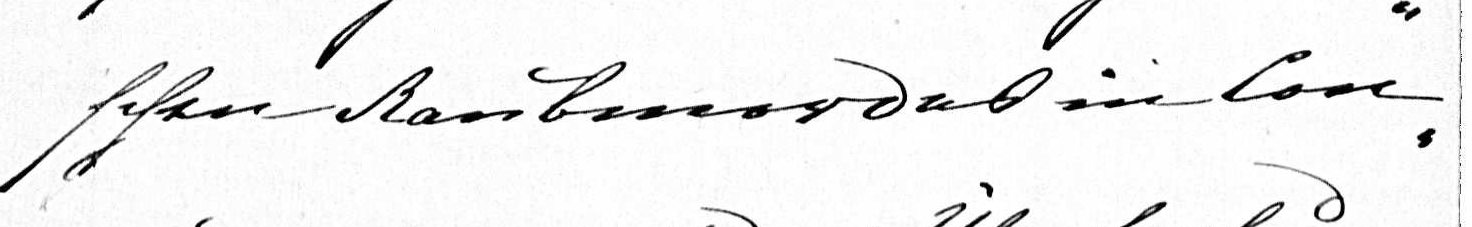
schen Raubmordes in Con¬
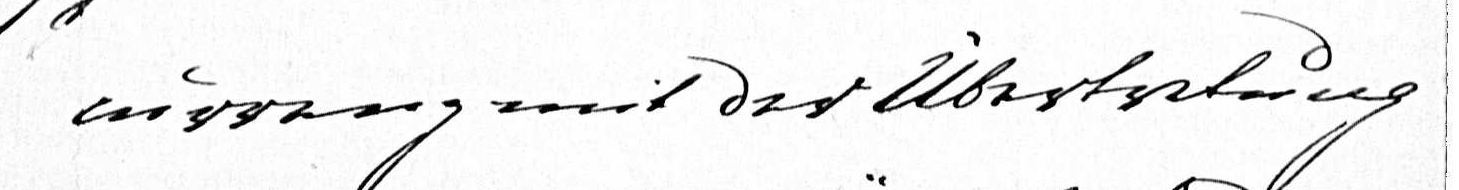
currenz mit der Übertretung
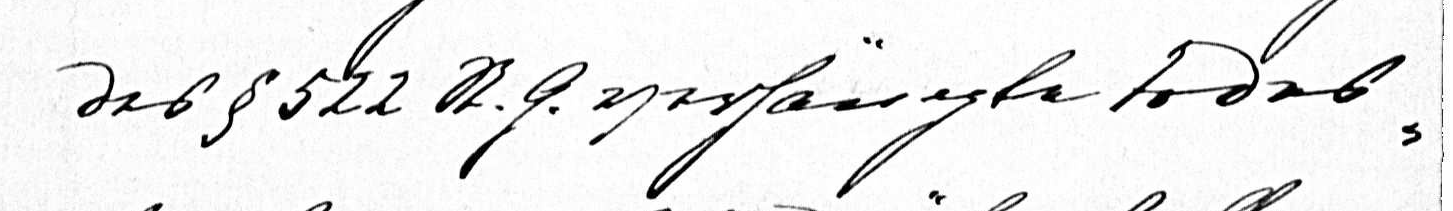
des §522 St G verhängte Todes¬
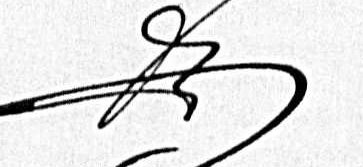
FJ
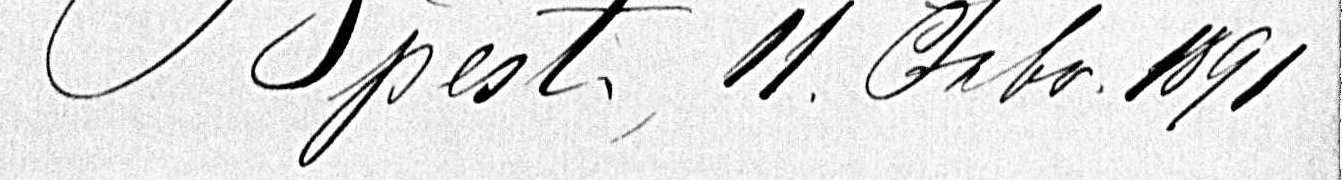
Bpest, 11 Febr 1891
